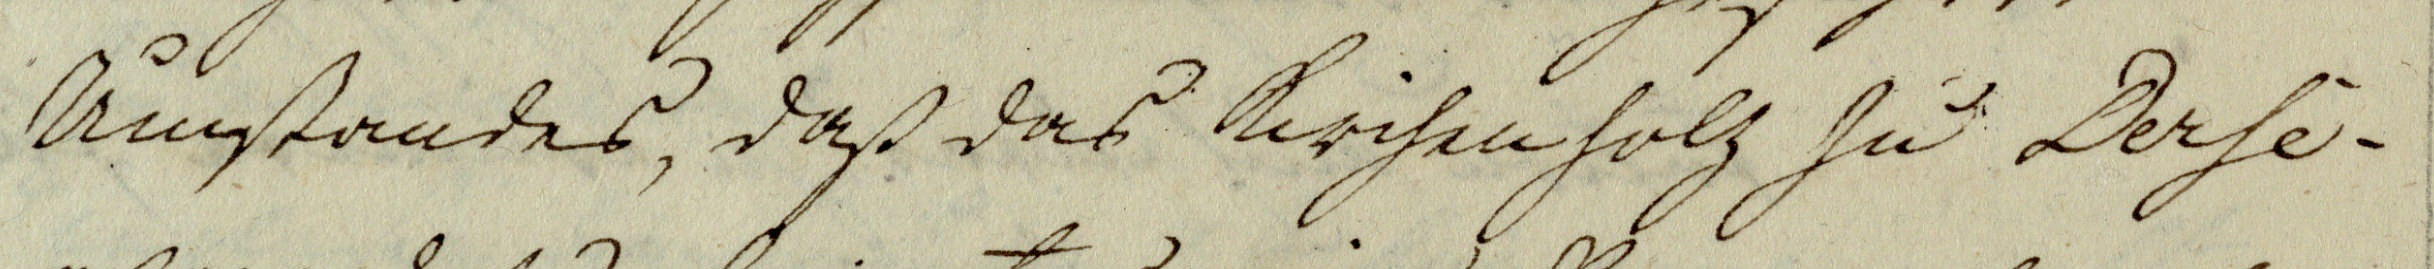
Umstandes, daß das Kirchenholz zu Derse
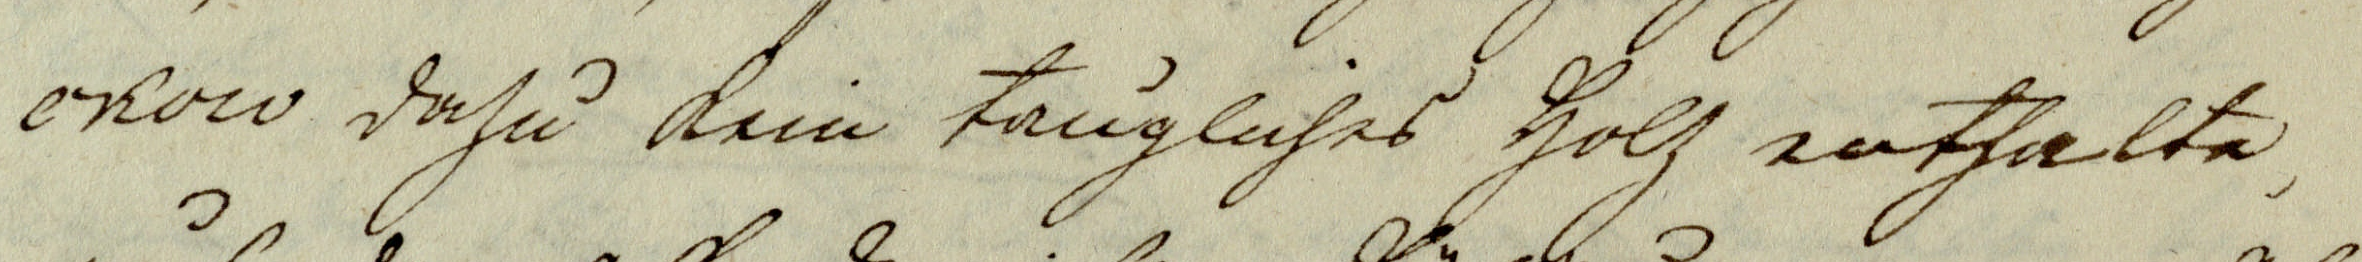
ckow dazu kein taugliches Holz enthalte,
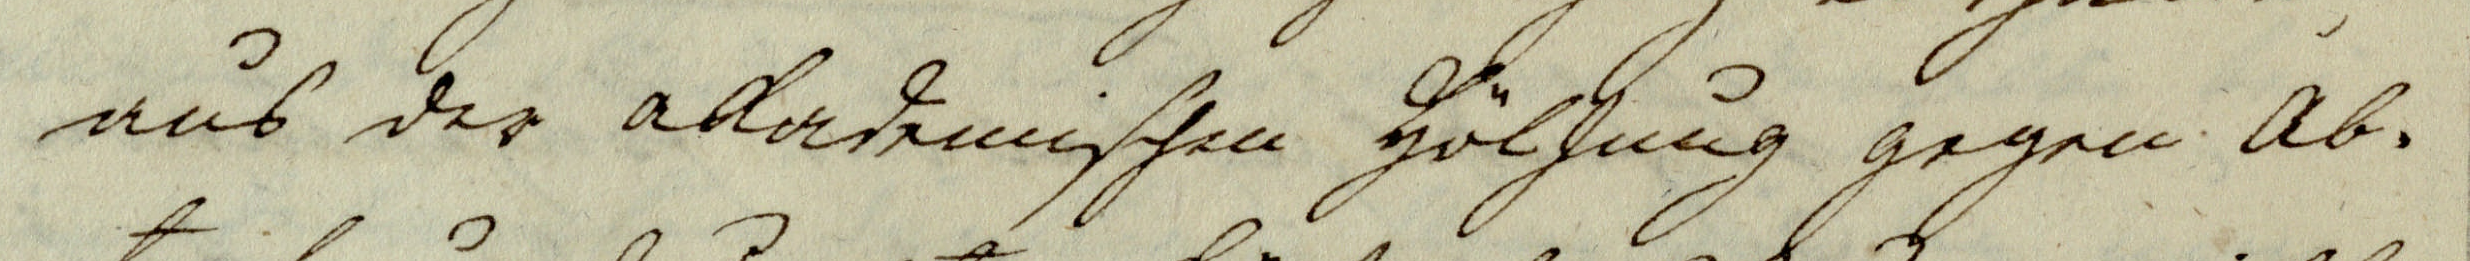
aus der akademischen Hölzung gegen Ab¬
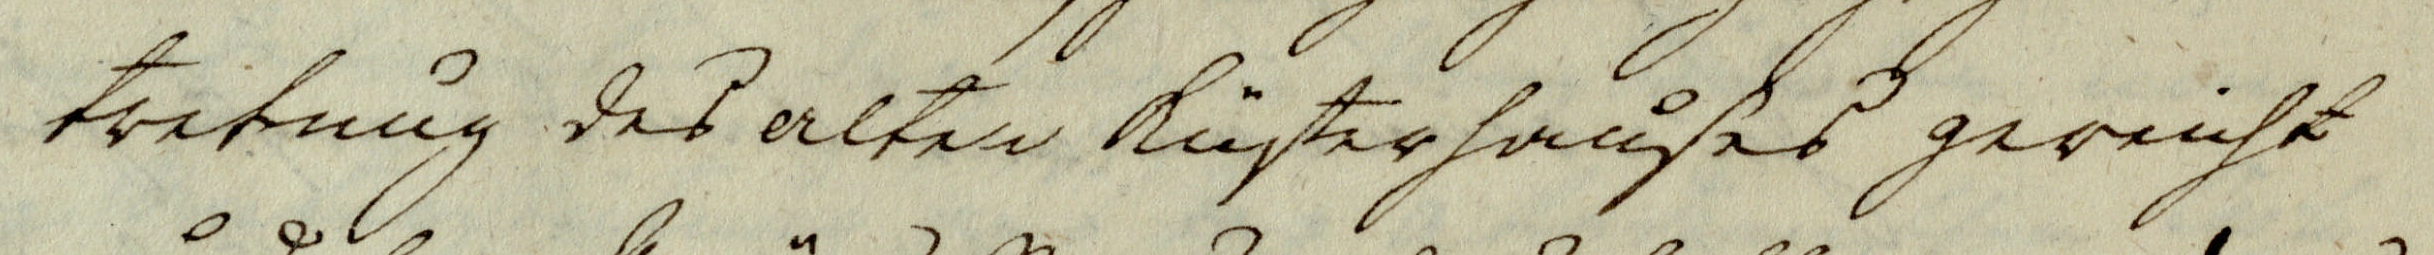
tretung des alten Küsterhauses gereicht
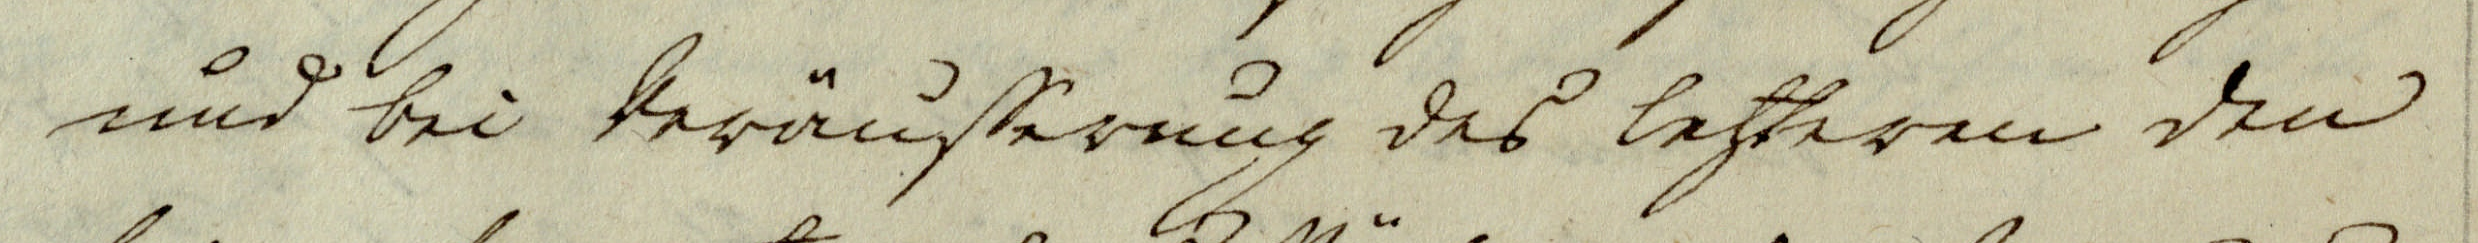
und bei Veräusserung des letzteren den
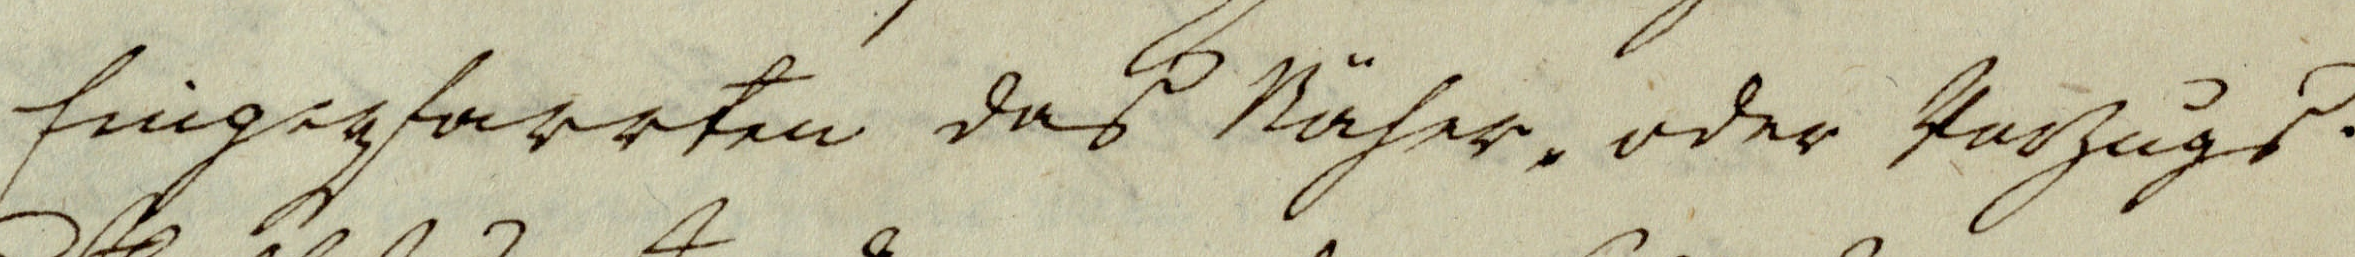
Eingepfarrten das Näher- oder Vorzugs¬
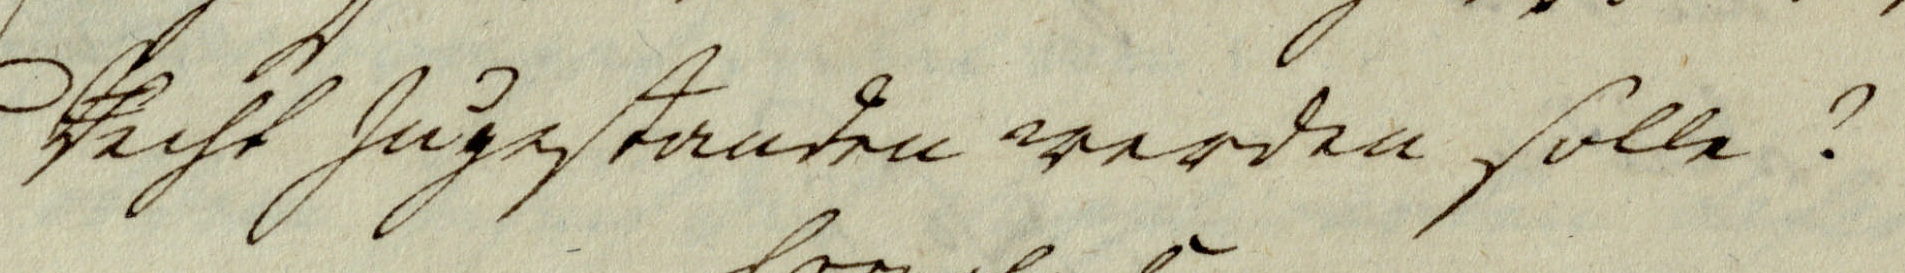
Recht zugestanden werden solle?
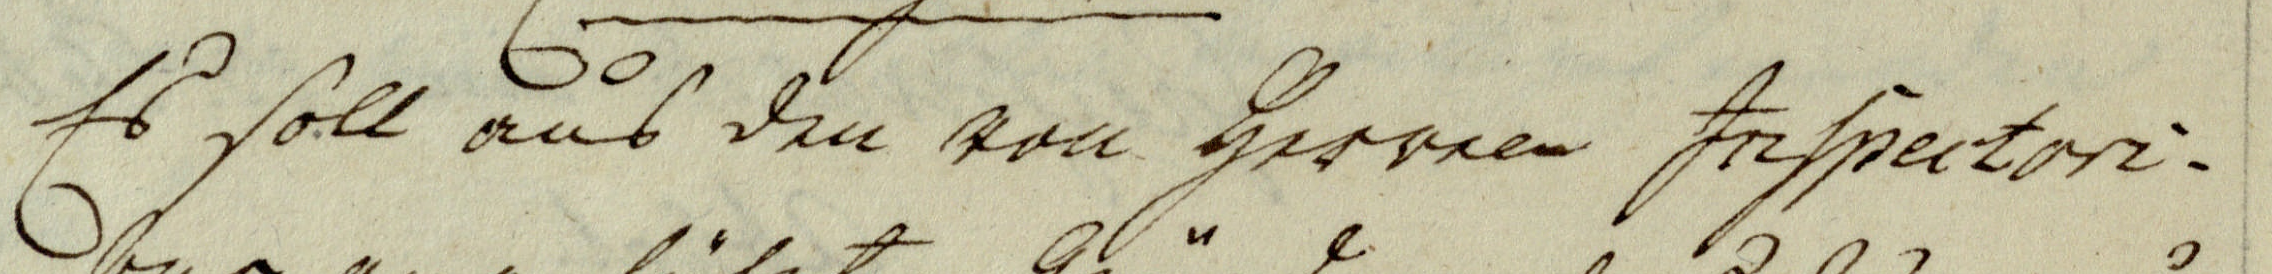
Es soll aus dem von Herren Inspectori¬
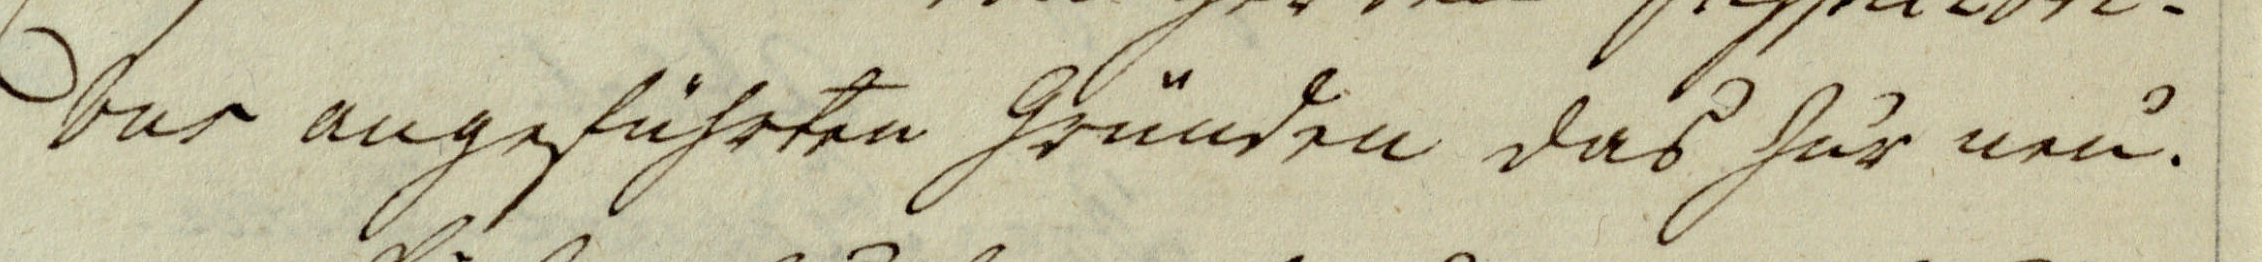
bus angeführten Gründen das zur neu¬
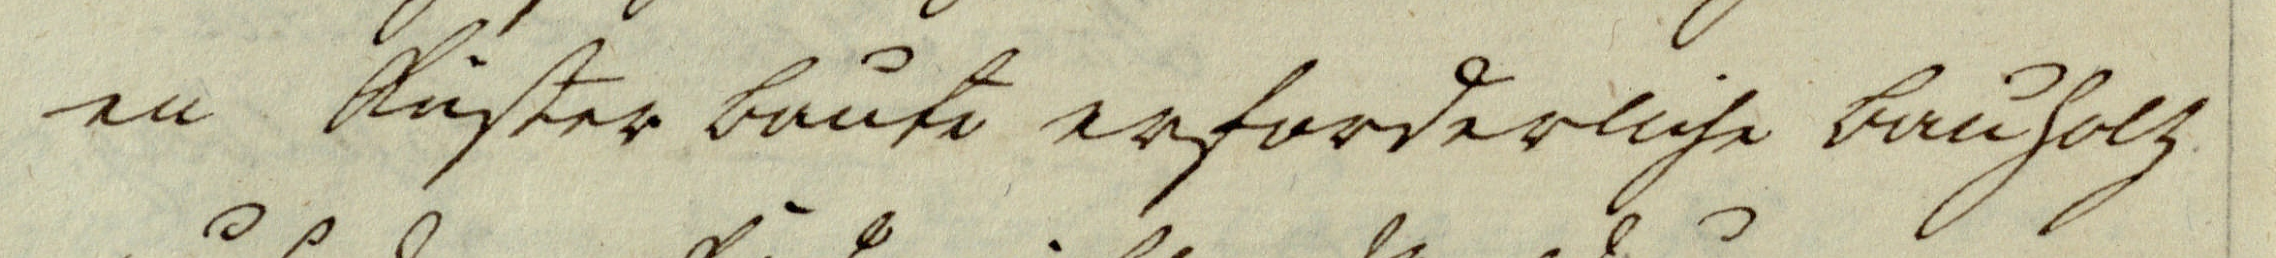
en Küster Baute erforderliche Bauholz
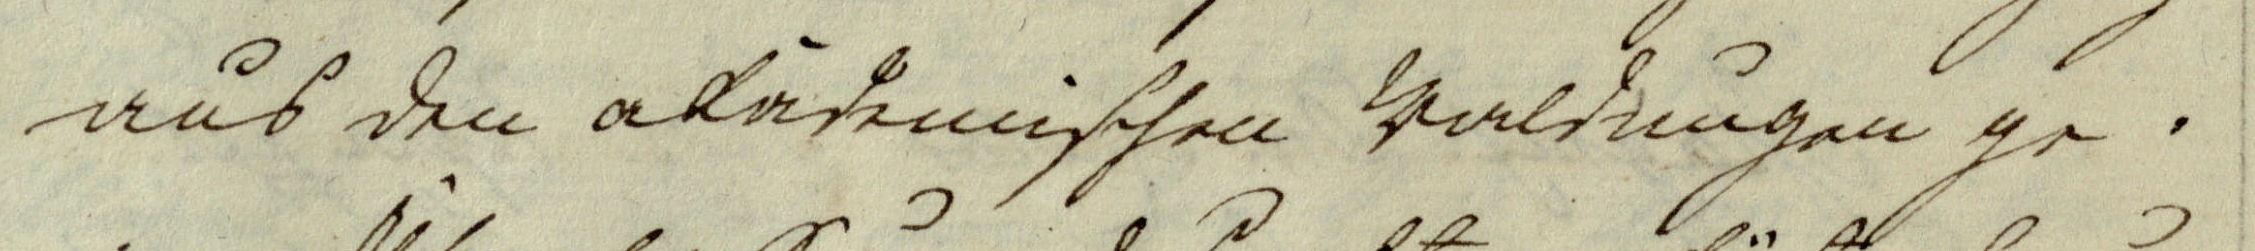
aus den akademischen Waldungen ge¬
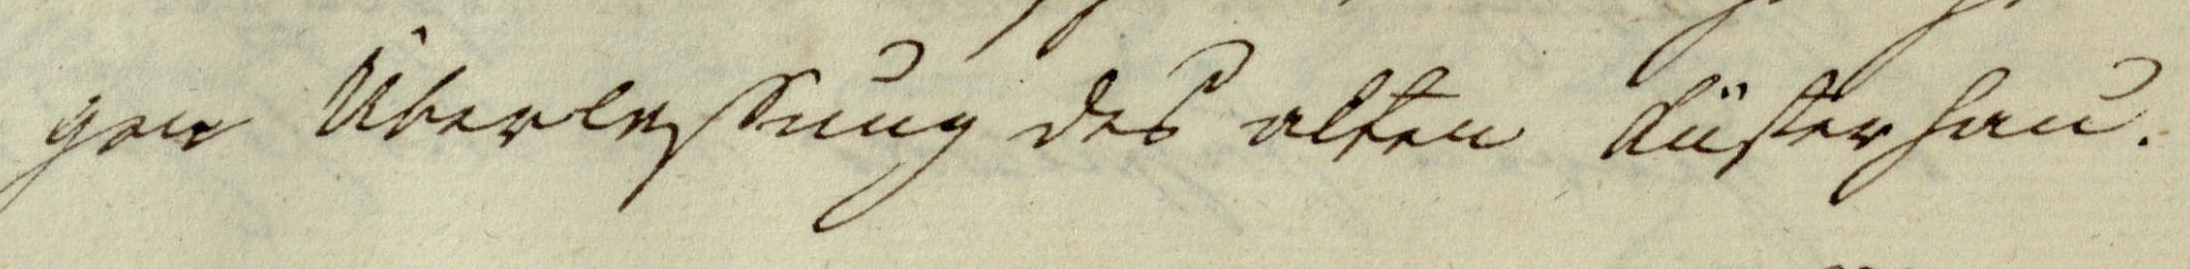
gen Überlassung des alten Küsterhau¬
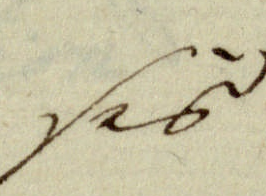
ses
